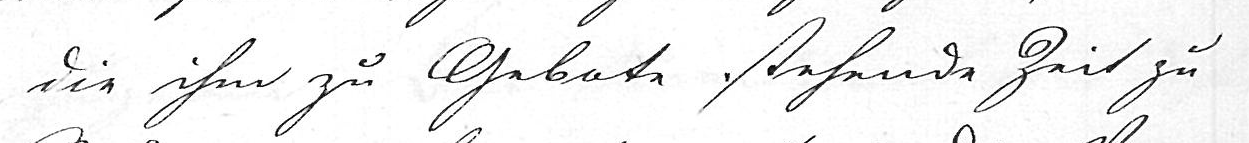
die ihm zu Gebote stehende Zeit zu
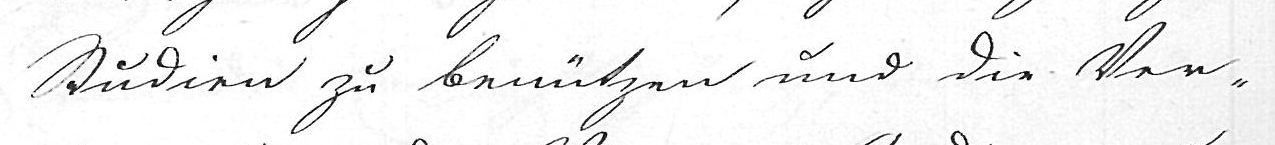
Studien zu benützen und die Ver-
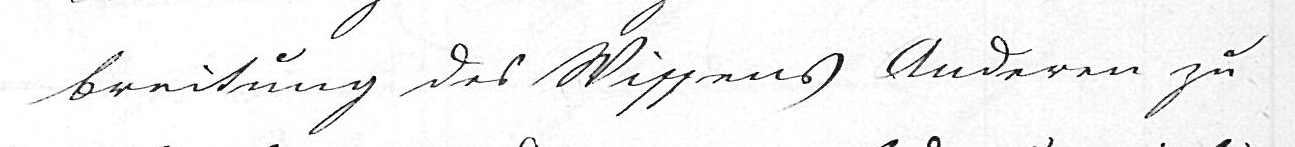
breitung des Wissens Anderen zu
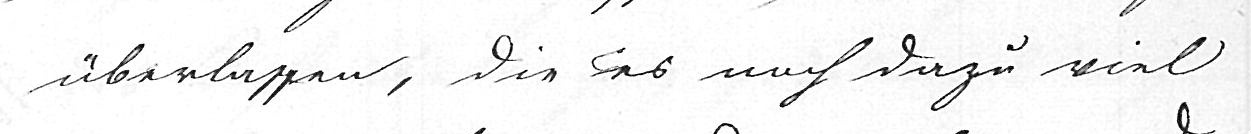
überlassen, die es noch dazu viel
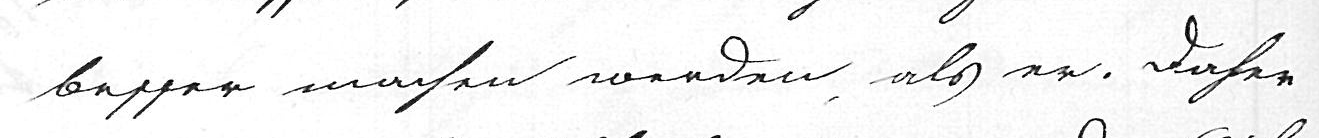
besser machen werden, als er. Daher
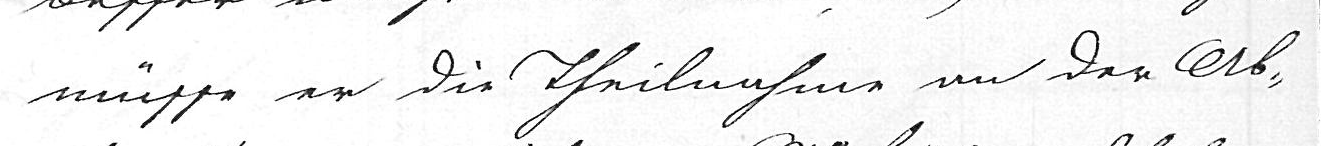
müsse er die Theilnahme an der Ab-
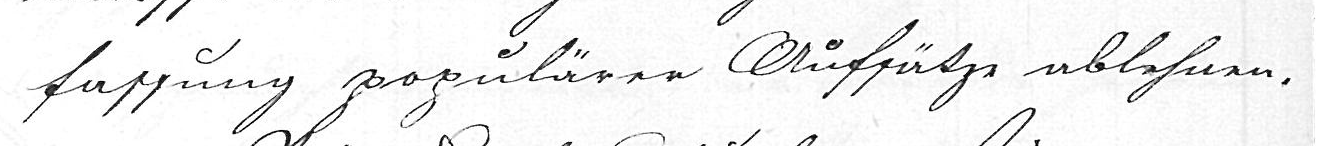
fassung populärer Aufsätze ablehnen.
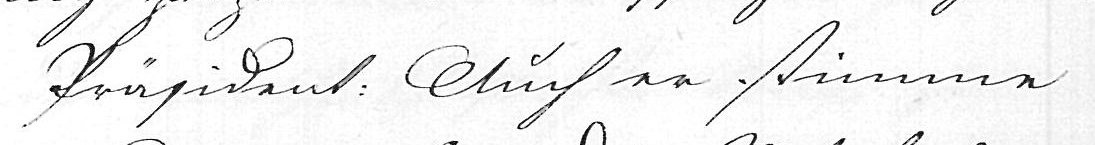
Präsident: Auch er stimme
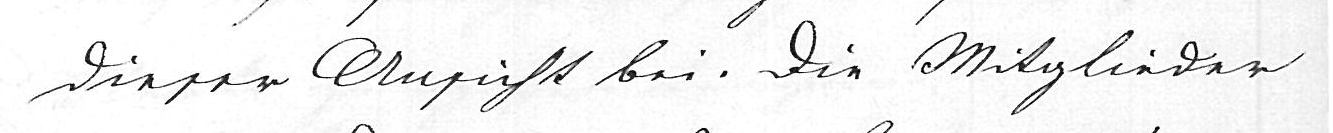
dieser Ansicht bei. Die Mitglieder
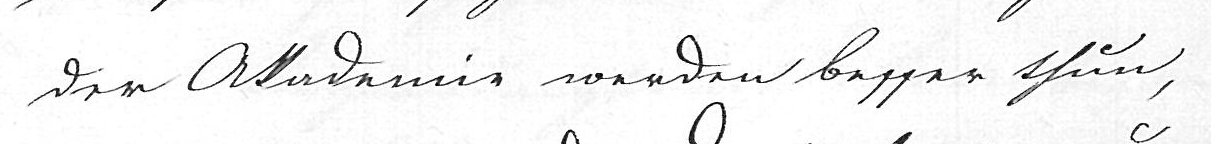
der Akademie werden besser thun,
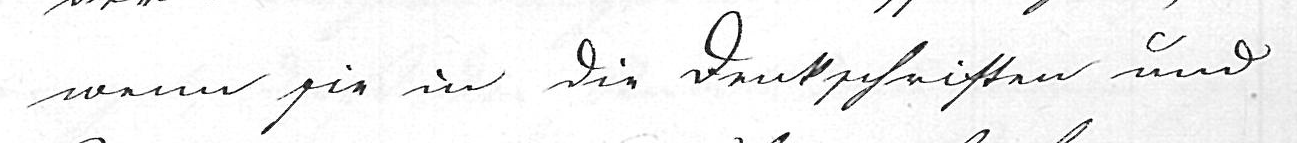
wenn sie in die Denkschriften und
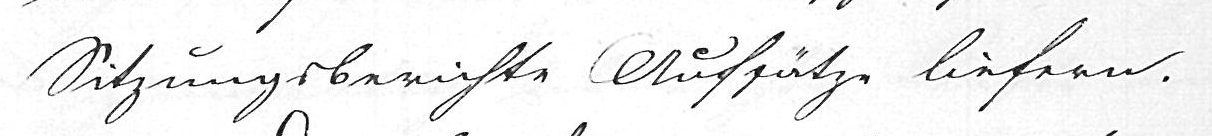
Sitzungsberichte Aufsätze liefern.
